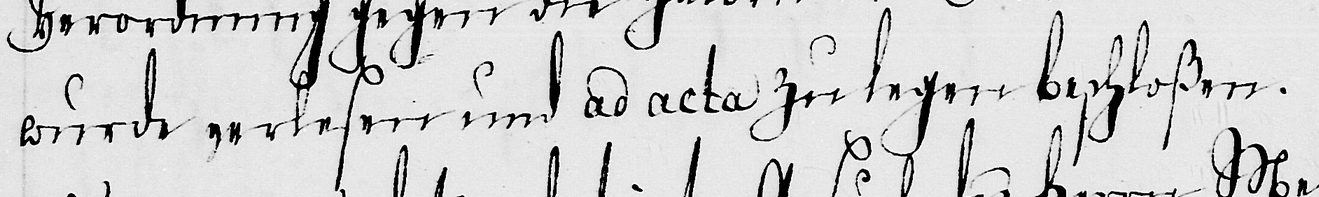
wurde verlesen und ad acta zu legen beschloßen.
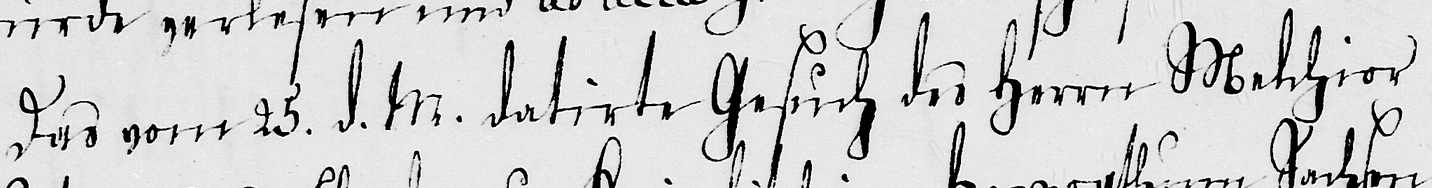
Das vom 25. d. M. datirte Gesuch des Herrn Melchior
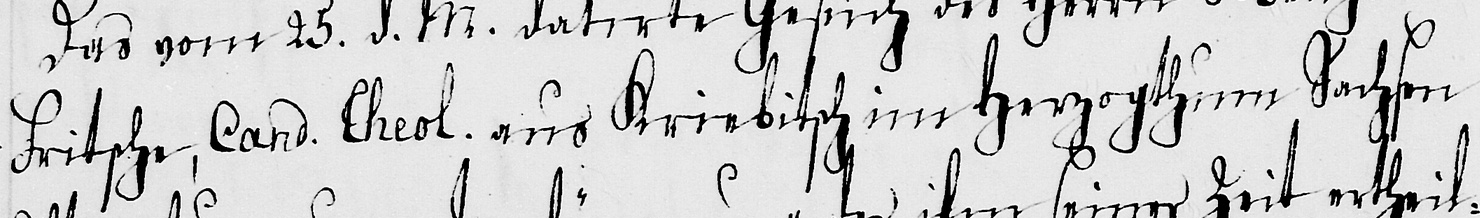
Fritsche, cand. theol. aus Kriebitsch im Herzogthum Sachsen
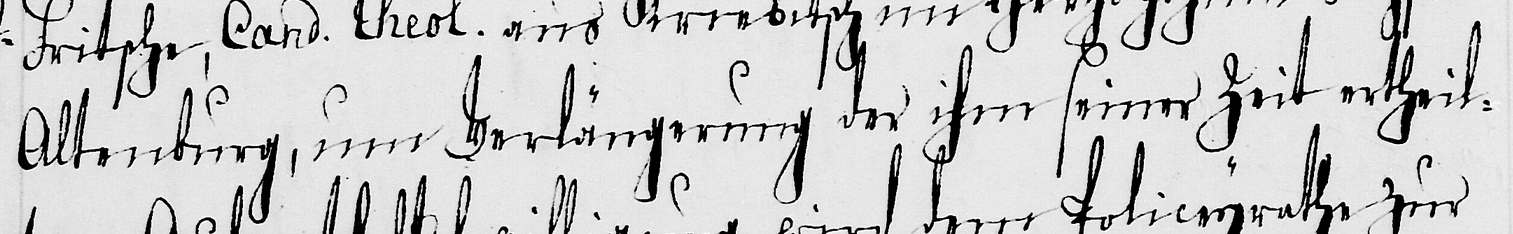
Altenburg, um Verlängerung der ihm seiner Zeit ertheil¬
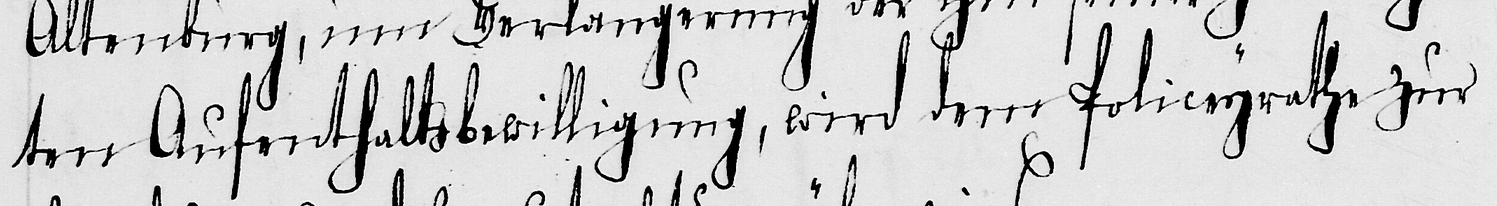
ten Aufenthaltsbewilligung, wird dem Policeyrathe zur
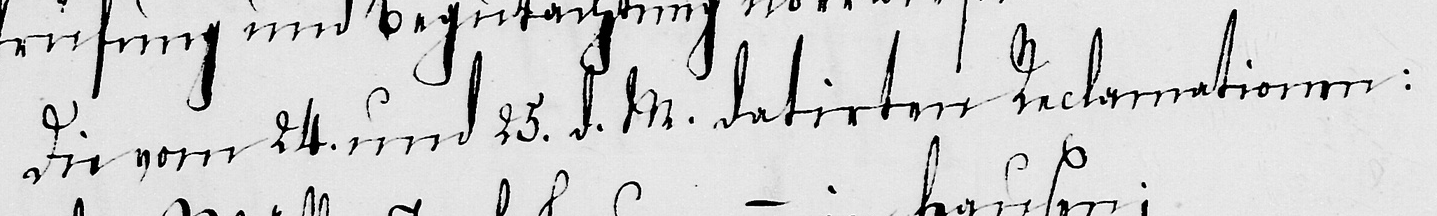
Die vom 24. und 25. d. M. datirten Reclamationen:
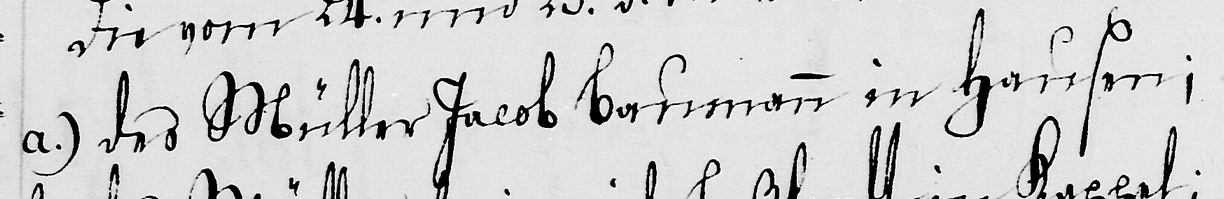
a.) des Müller Jacob Baumann in Hausen;
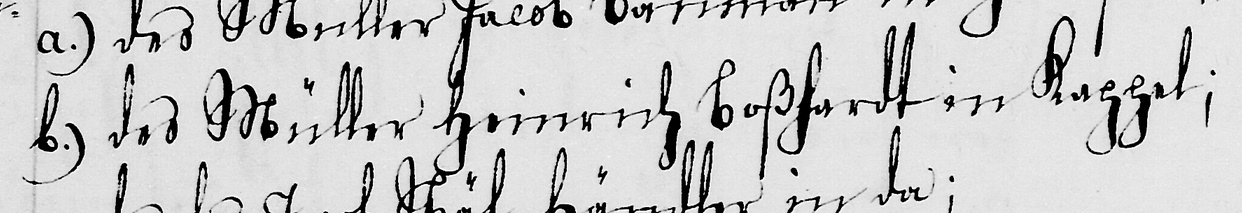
b.) des Müller Heinrich Boßhardt in Kappel;
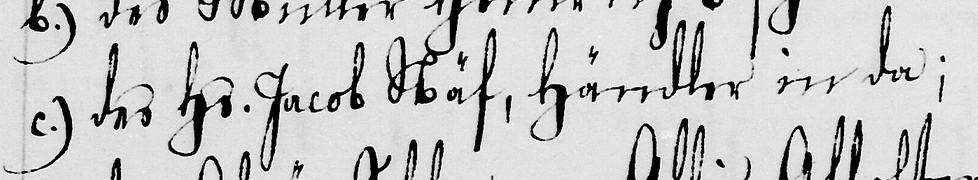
c.) des Hs. Jacob Näf, Händler in da;
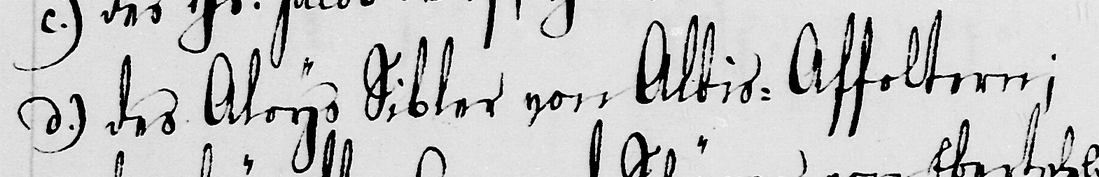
d.) des Aloys Sibler von Albis-Affoltern;
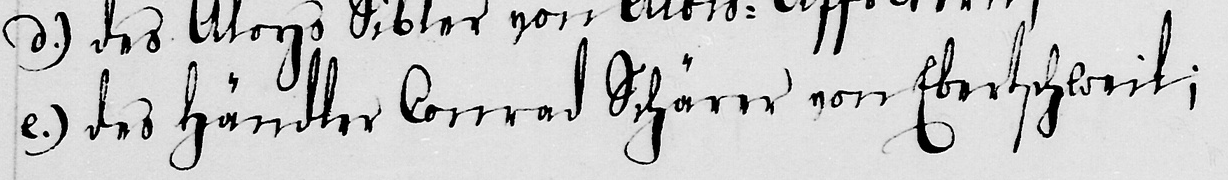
e.) des Händler Conrad Schärer von Ebertschweil;
